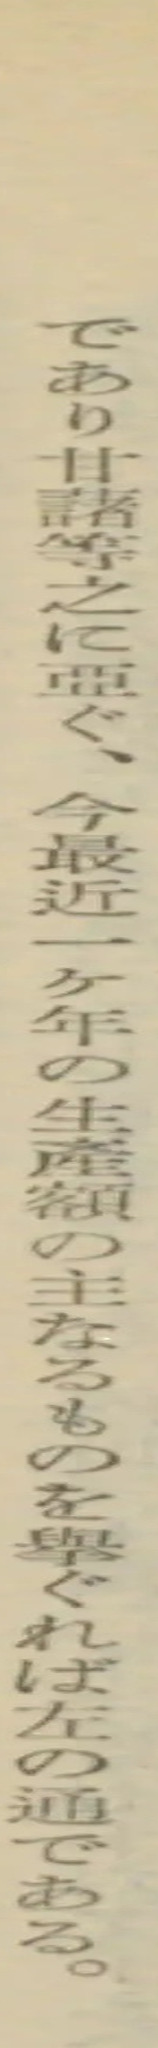であり甘藷等之に亜ぐ、今最近一ヶ年の生産額の主なるものを挙ぐれば左の通である。
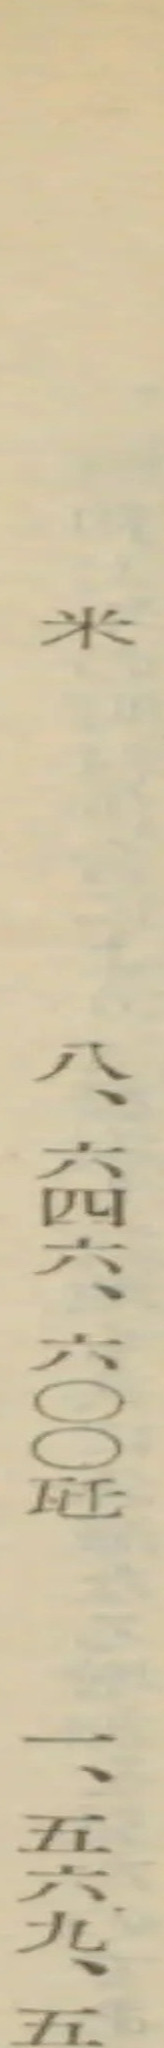米八、六四六、六〇〇瓩一、五六九、五八一円
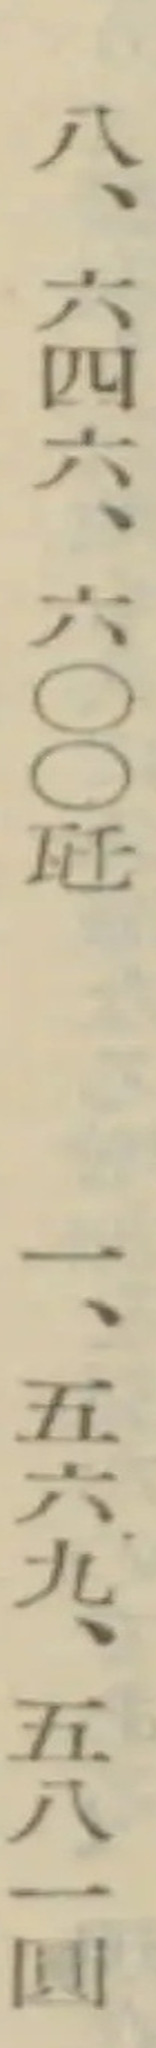米八、六四六、六〇〇瓩一、五六九、五八一円
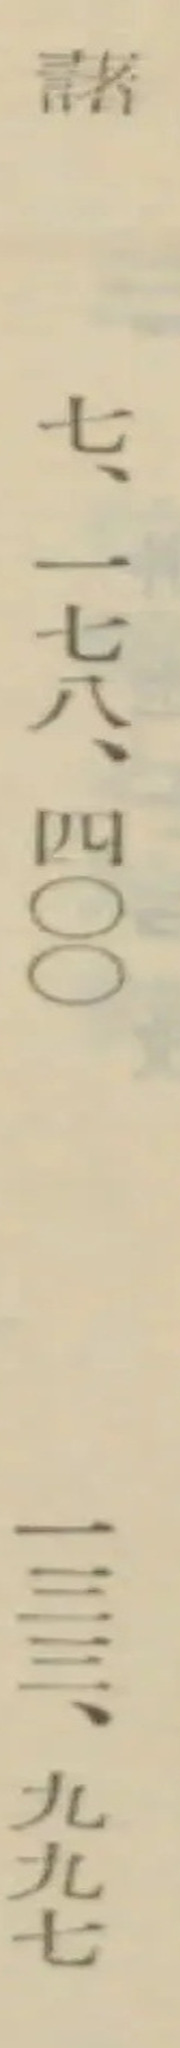甘藷七、一七八、四〇〇一三三、九九七
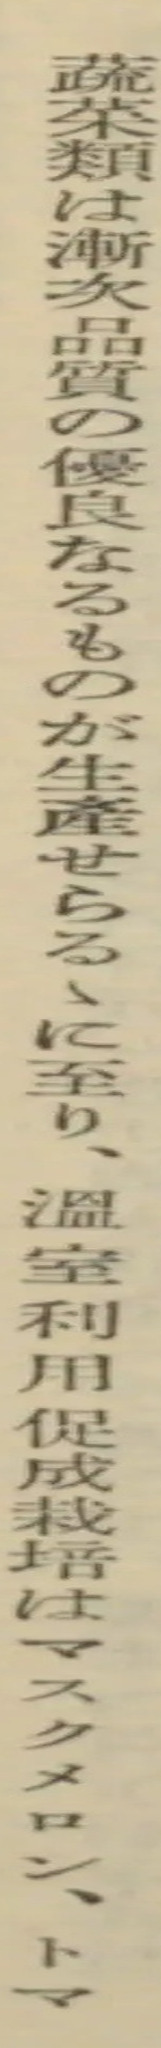蔬菜類は漸次品質の優良なるものが生産せらるゝに至り、温室利用促成栽培はマスクメロン、トマ
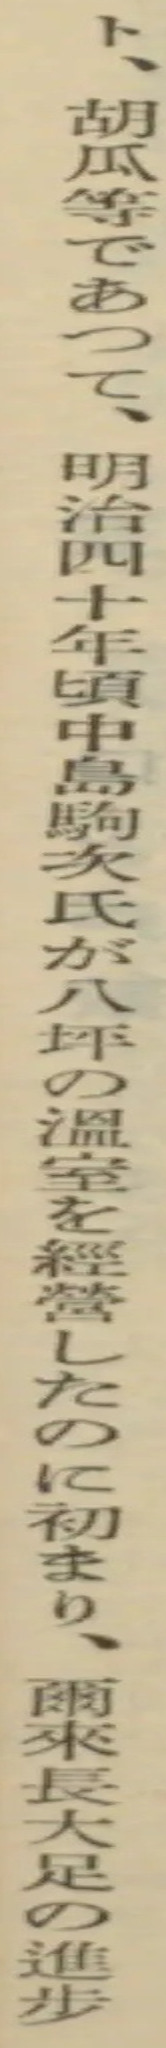ト、胡瓜等であつて、明治四十年頃中島駒次氏が八坪の温室を経営したのに初まり、爾来長大足の進歩
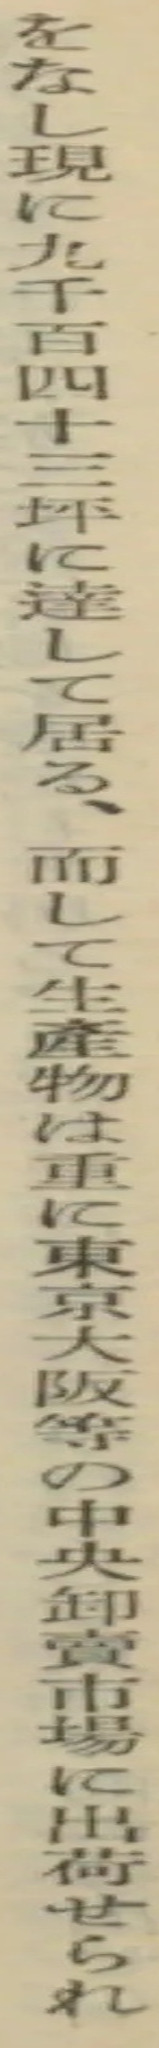をなし現に九千百四十三坪に達して居る、而して生産物は重に東京大阪等の中央卸売市場に出荷せられ
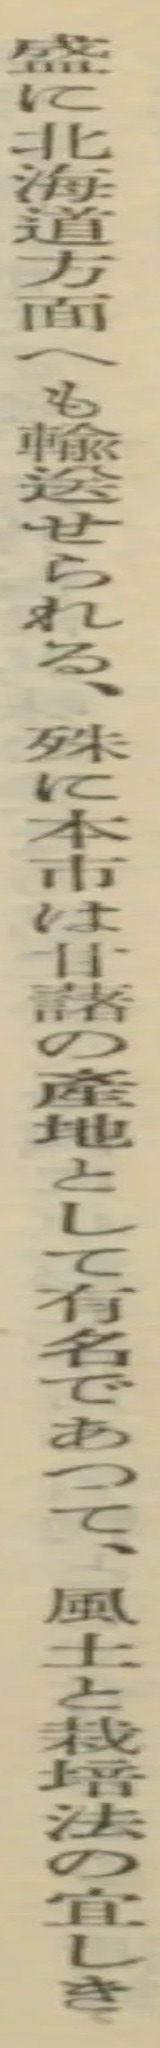盛に北海道方面へも輸送せられる、殊に本市は甘藷の産地として有名であつて、風土と栽培法の宜しき
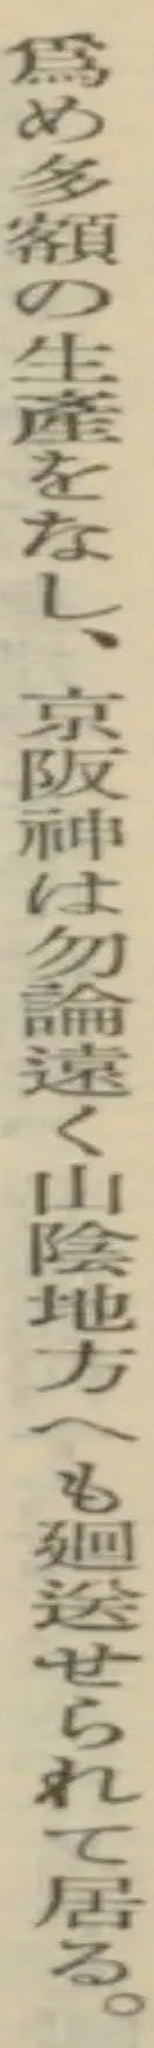為め多額の生産をなし、京阪神は勿論遠く山陰地方へも廻送せられて居る。
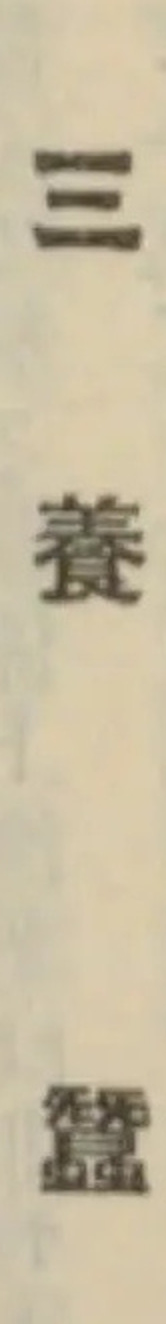三養蚕
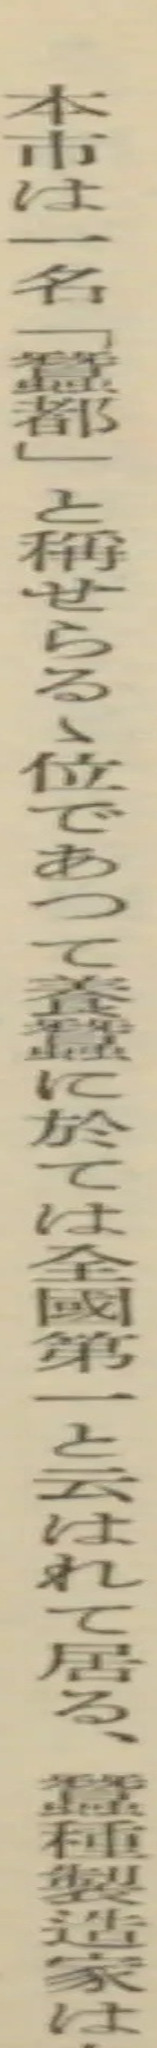本市は一名「蚕都」と称せらるゝ位であつて養蚕に於ては全国第一と云はれて居る。蚕種製造家は九
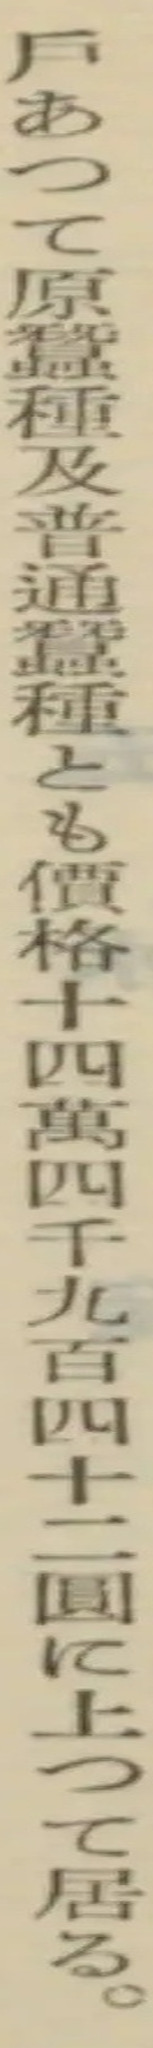戸あつて原蚕種及普通蚕種とも価格十四万四千九百四十二円に上つて居る。
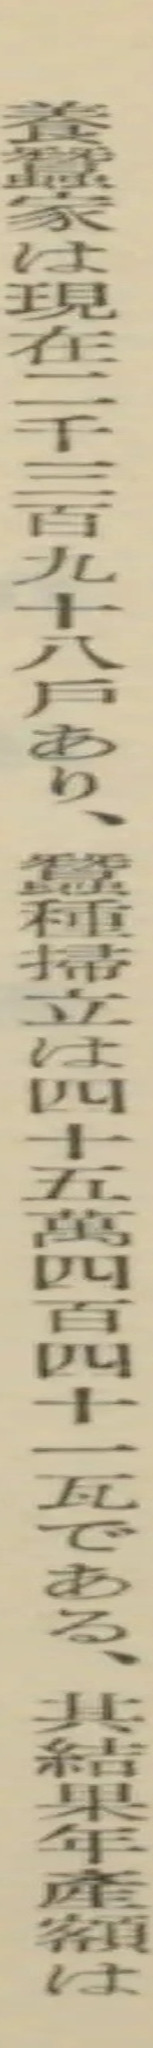養蚕家は現在二千三百九十八戸あり、蚕種掃立は四十五万四百四十一瓦である、其結果年産額は
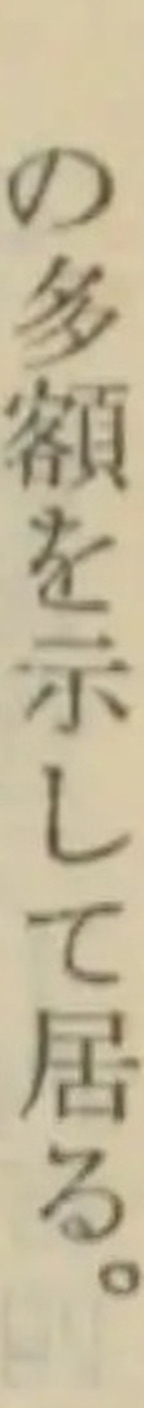の多額を示して居る。
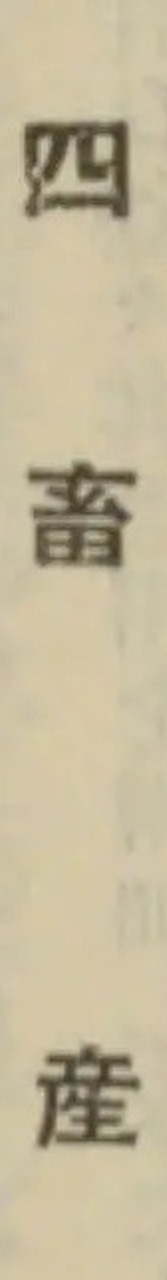四畜産

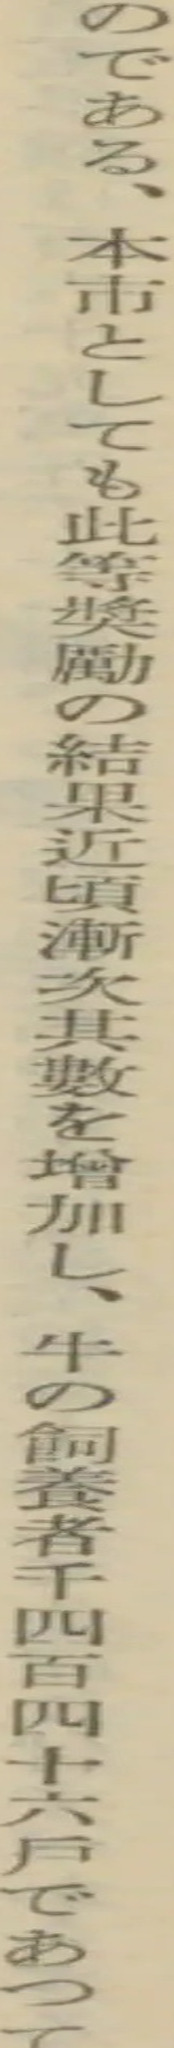ものである、本市としても此等奨励の結果近頃漸次其数を増加し、牛の飼養者千四百四十六戸であつて
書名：産業の豊橋
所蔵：国立国会図書館 National Diet Library, JAPAN
